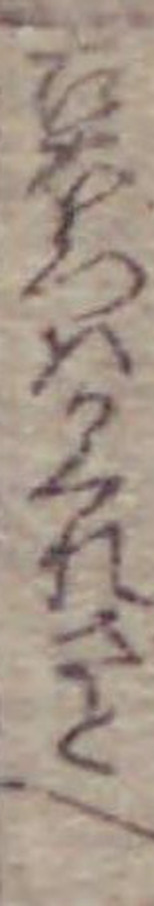古右衛門はかくれざと
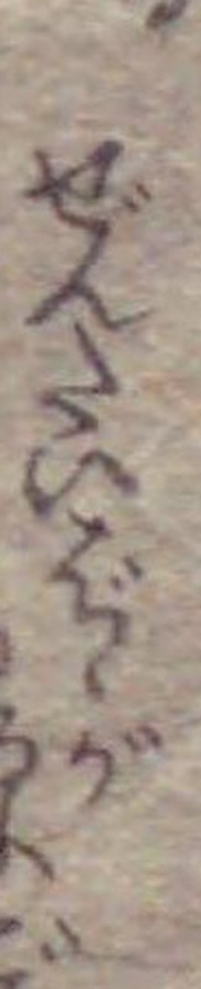ぜんたいばゞが
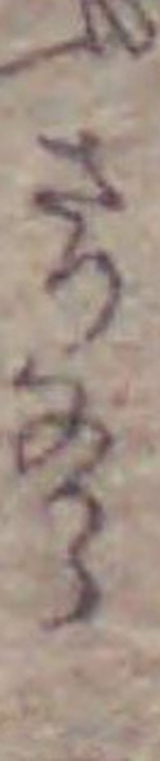さりなから
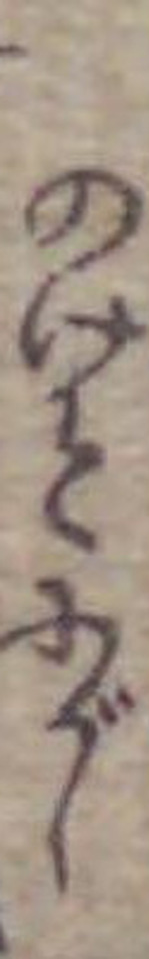のけとにがし
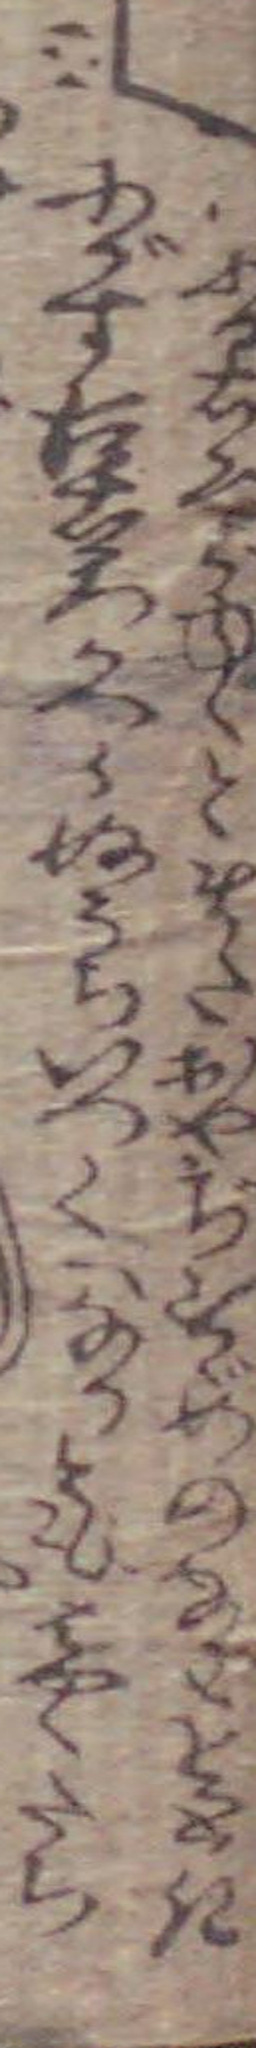にがす古右衛門かへらぬうちいつくへなりともはやくたち
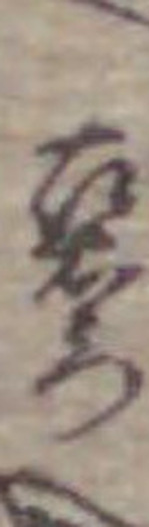古右衛門
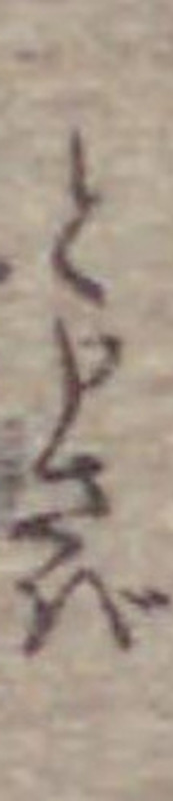と申さば
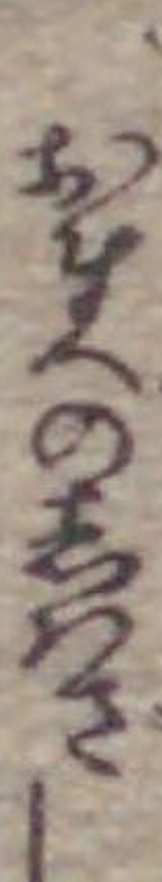おまへのしはざ
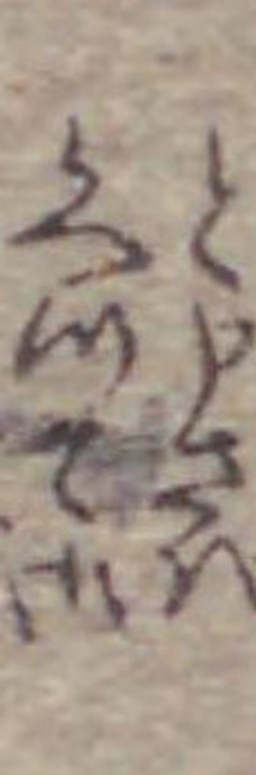かへつて御

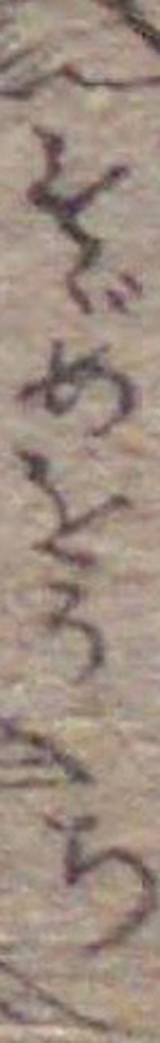すゞめをうち
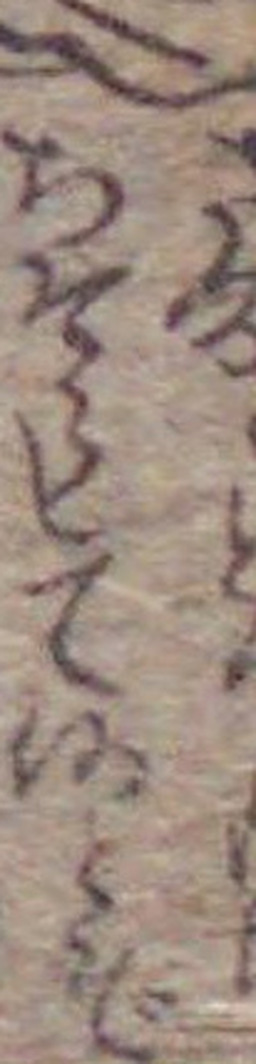ちそうして何とぞ
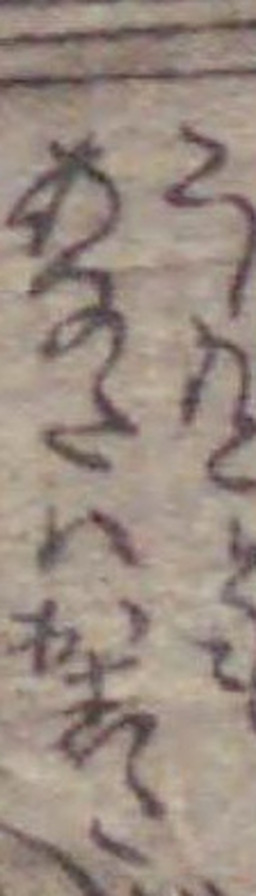あなたはおしたが
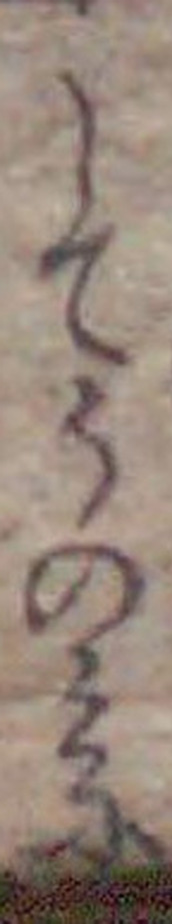してうのみに
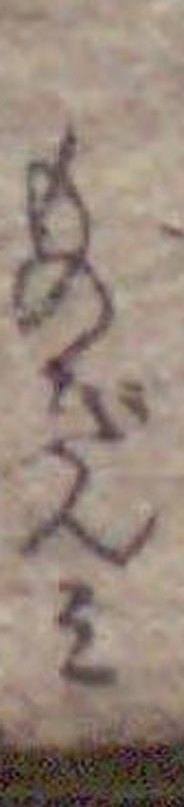ものぎんみ
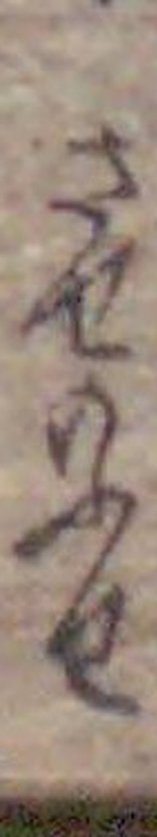させもふせ
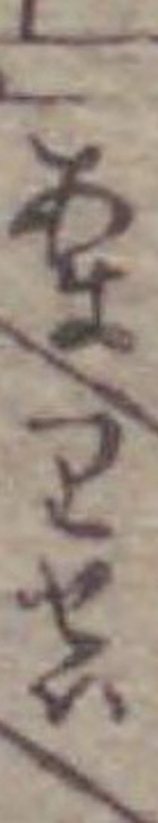あまりせは
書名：嘘八百温故新知 : 2巻
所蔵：国立国会図書館 National Diet Library, JAPAN
